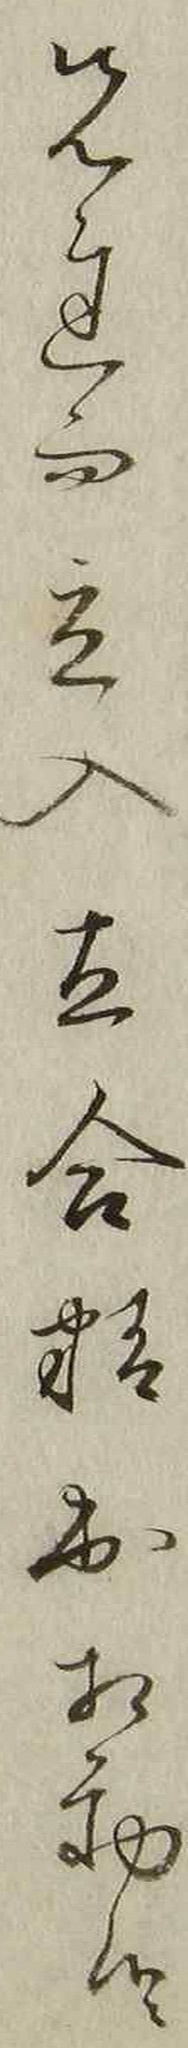先達而立入立合精出相勤候ニ
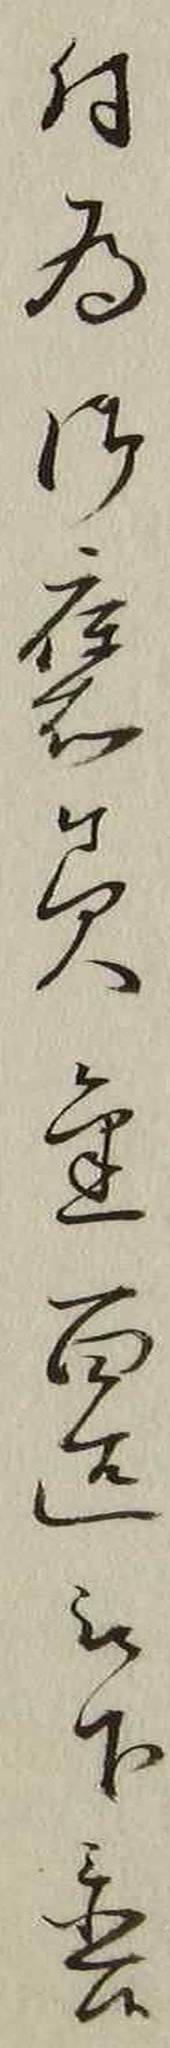付為御褒美金百疋被下置候
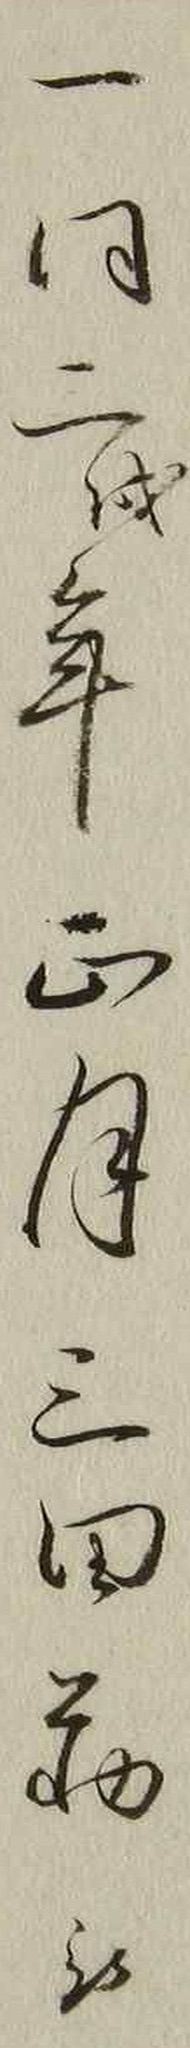一同二戌年正月三田勤被
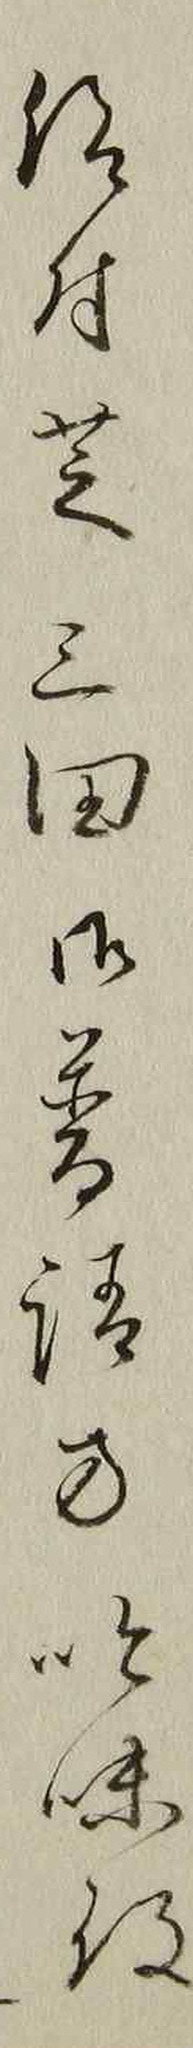仰付芝三田御普請方吟味役
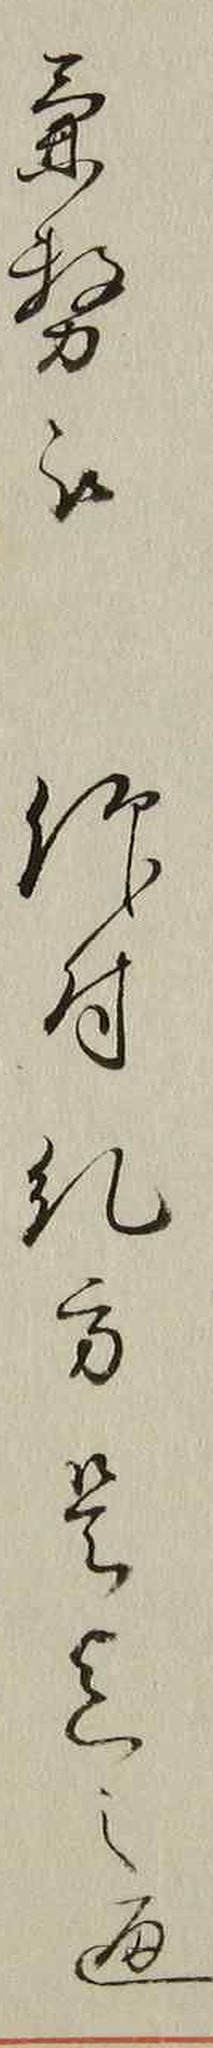兼務被仰付糺方是迄之通
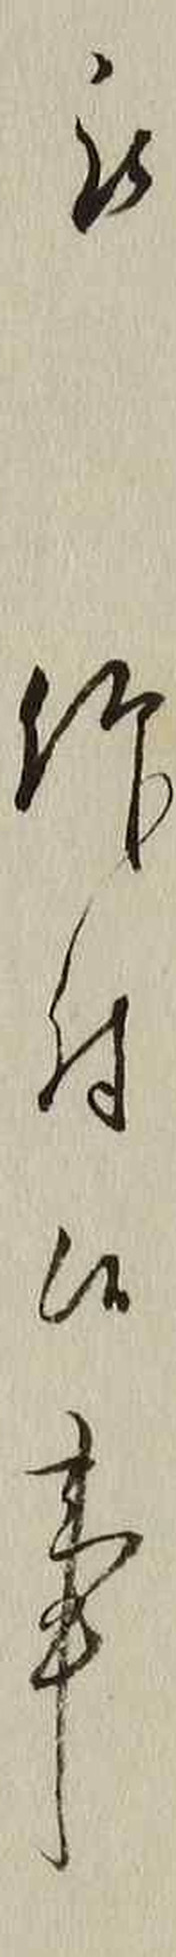被仰付候事
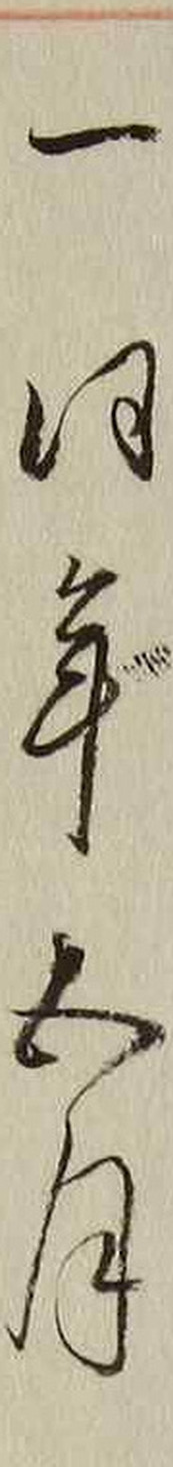一同年五月
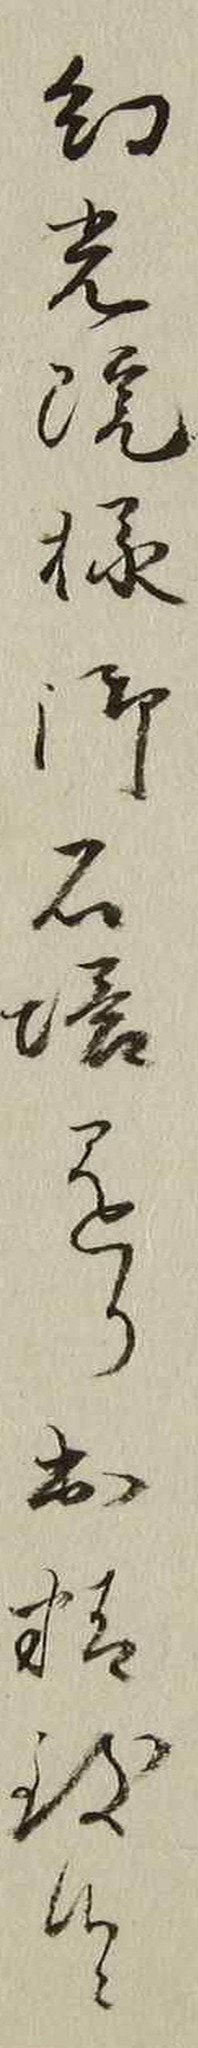約光院様御石塔懸り出精致候ニ
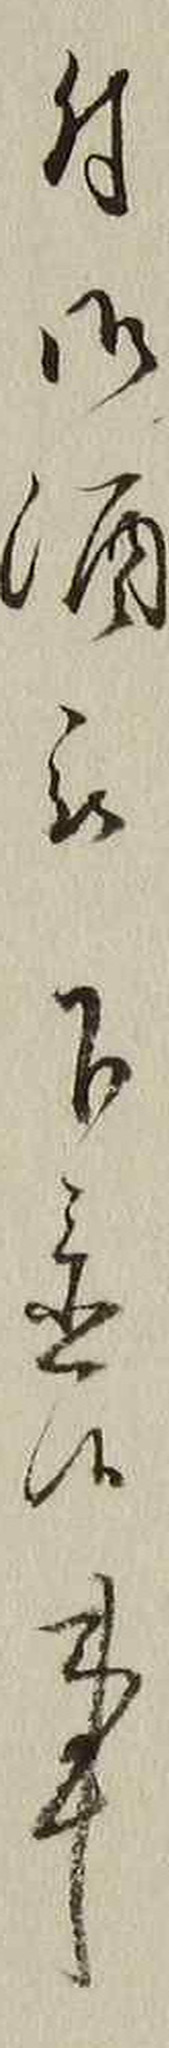付御酒被下置候事
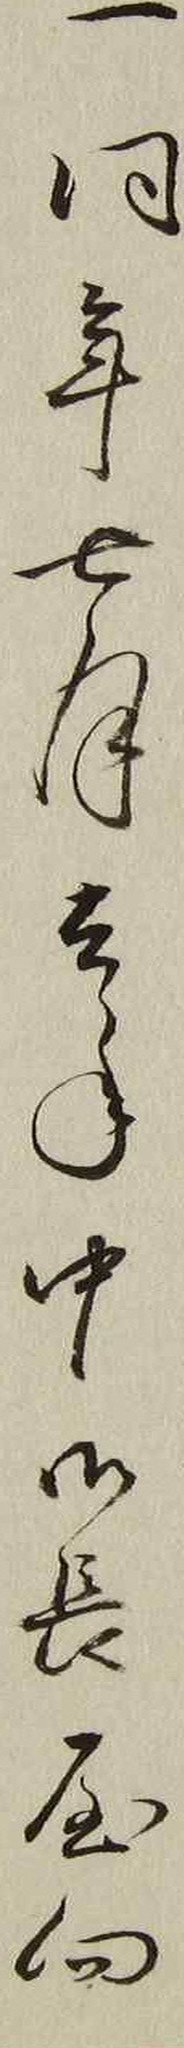一同年七月去年中御長屋向
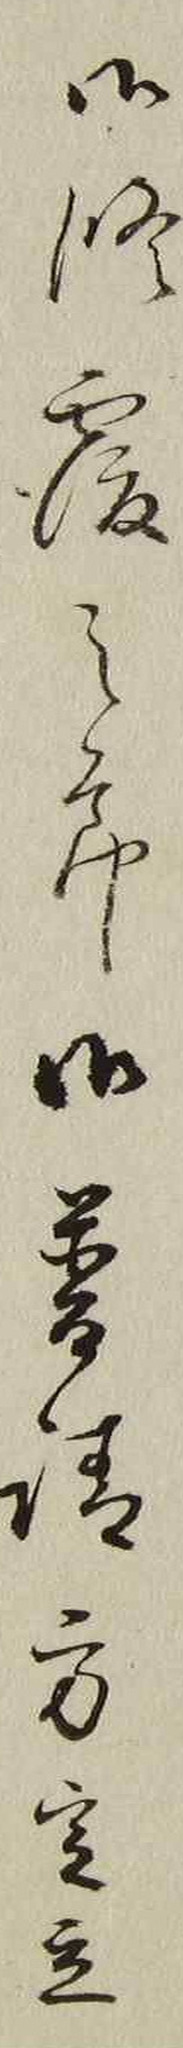御修覆之節御普請方定立
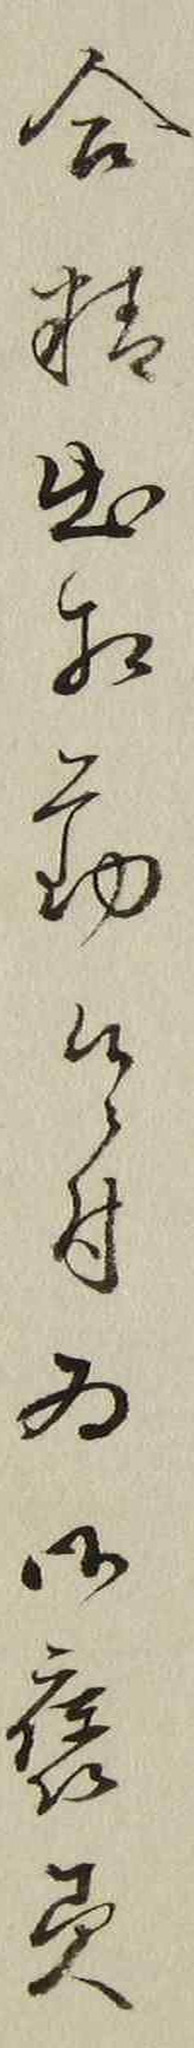合精出相勤候ニ付為御褒美
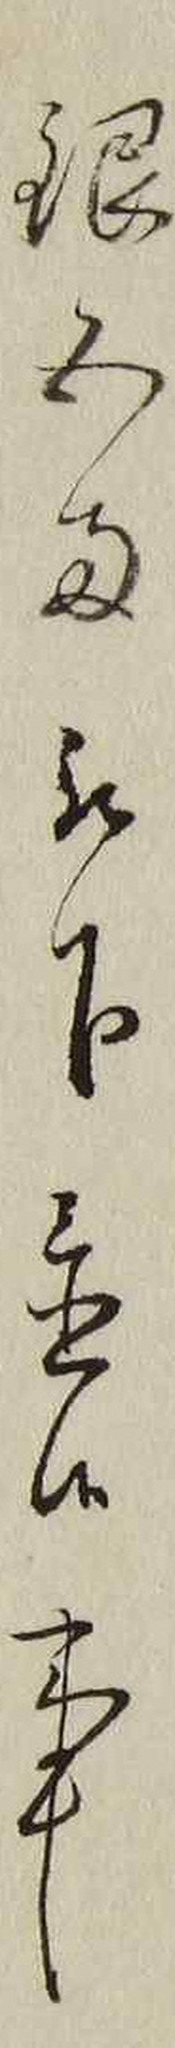銀五両被下置候事
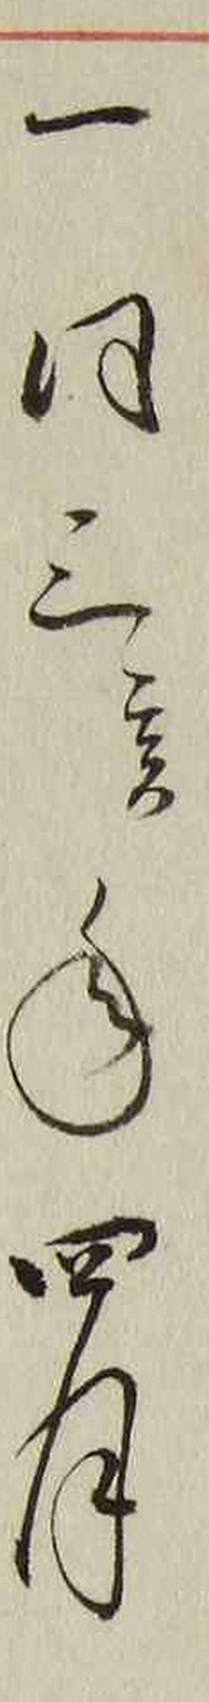一同三亥年四月
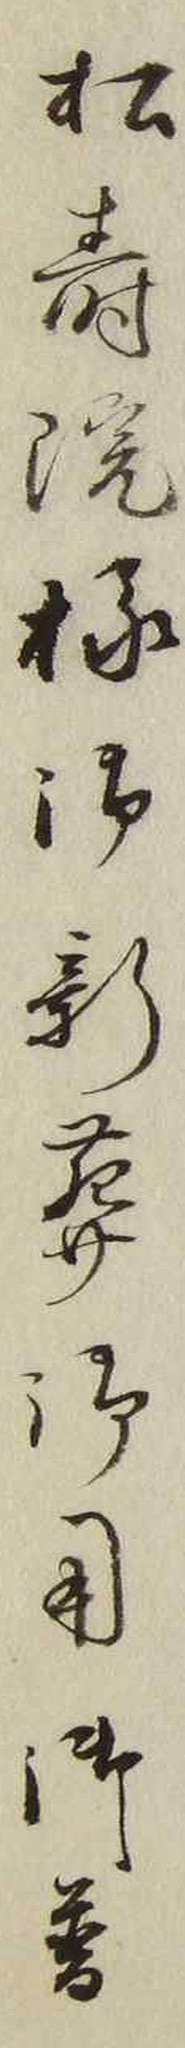松寿院様御新葬御用御普

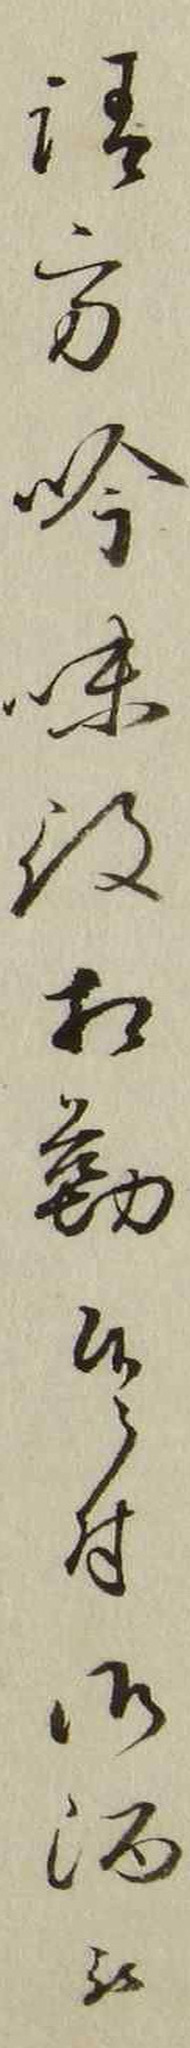請方吟味役相勤候ニ付御酒被
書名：諸士系譜　巻之8　い之部8
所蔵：会津若松市立会津図書館
